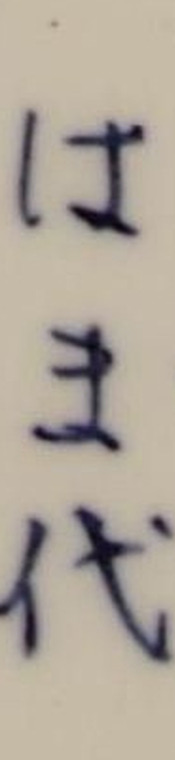はま代
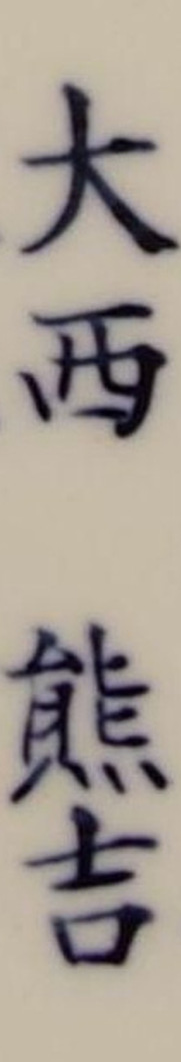大西熊吉
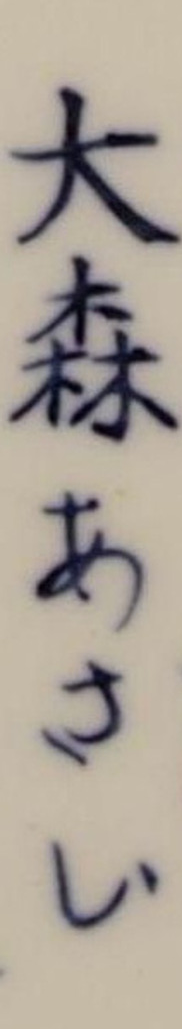大森あさい
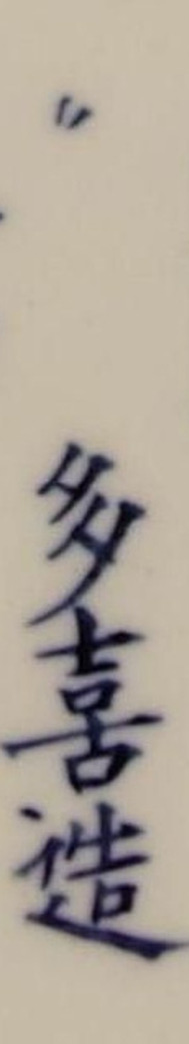多喜造
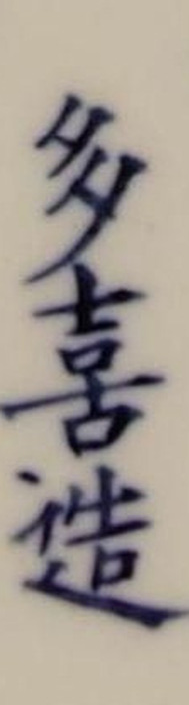多喜造
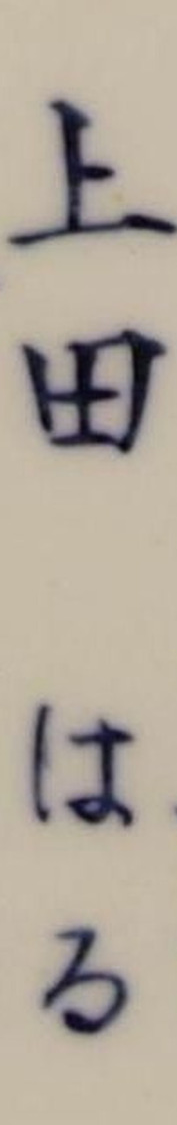上田はる
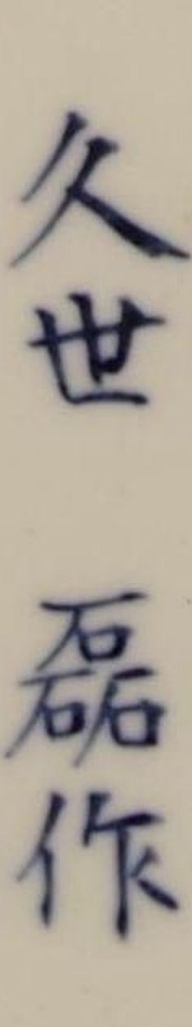久世磊作
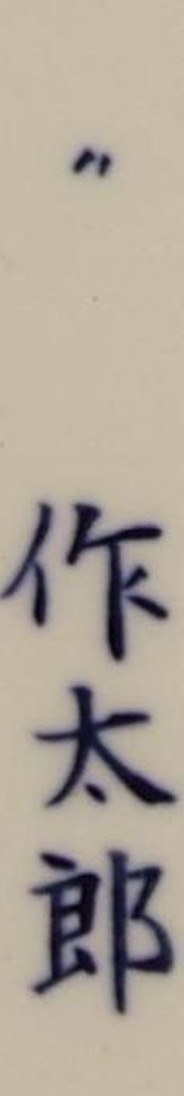作太郎
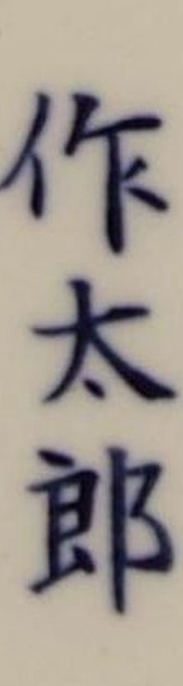作太郎
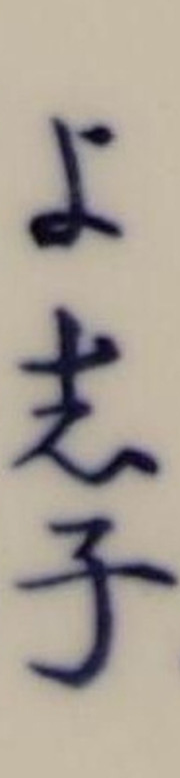よし子
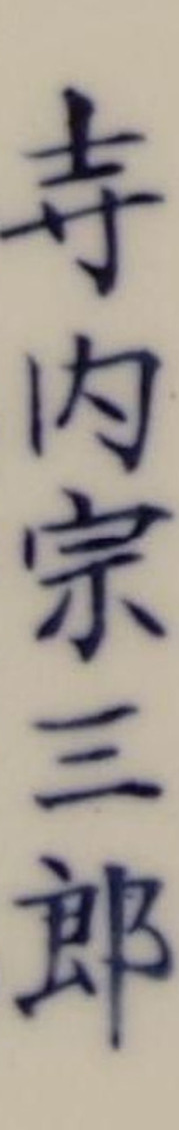寺内宗三郎
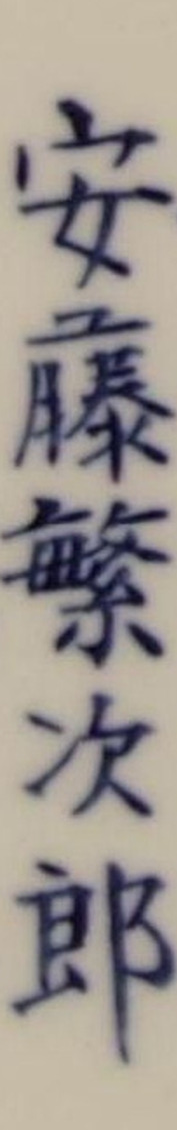安藤繁次郎
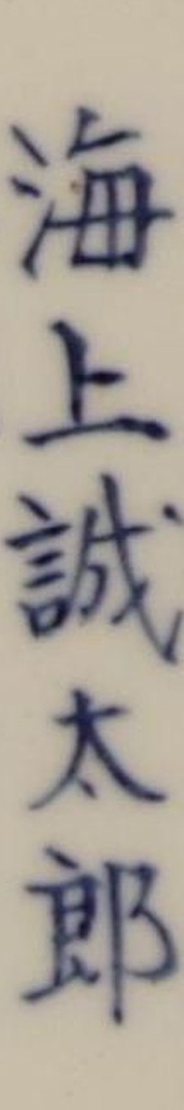海上誠太郎
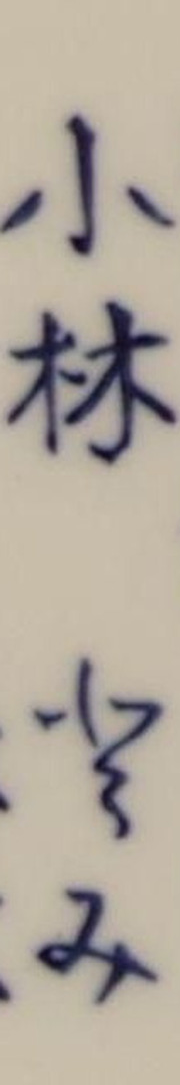小林とみ

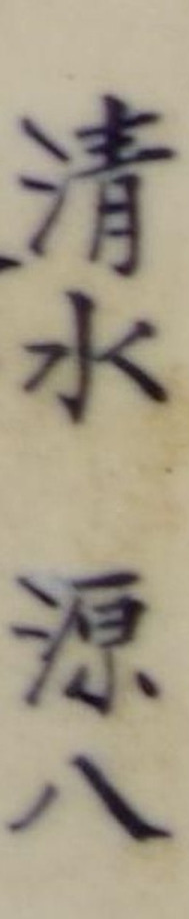清水源八
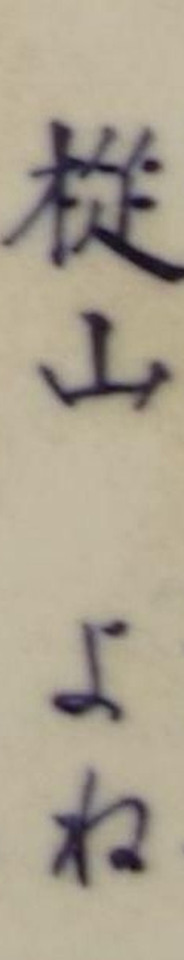樅山よね
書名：E~L
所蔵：高野山金剛峯寺
